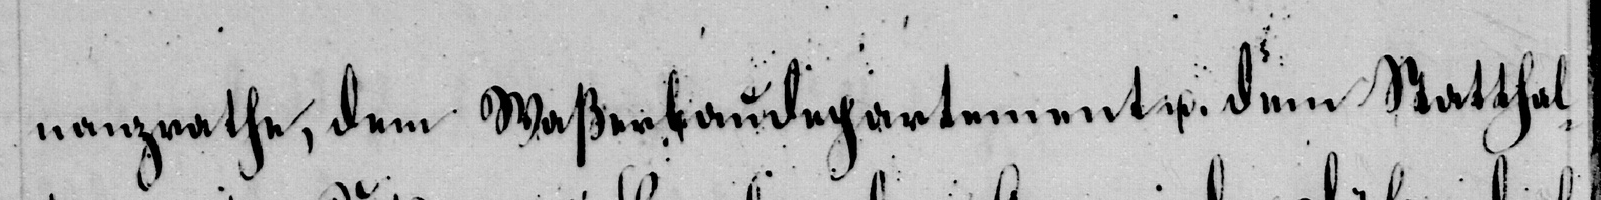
nanzrathe, dem Waßerbaudepartement u. dem Statthal¬
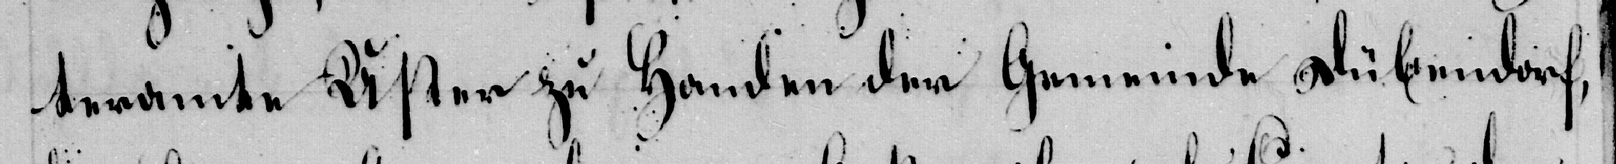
teramt Uster zu Handen der Gemeinde Dübendorf,
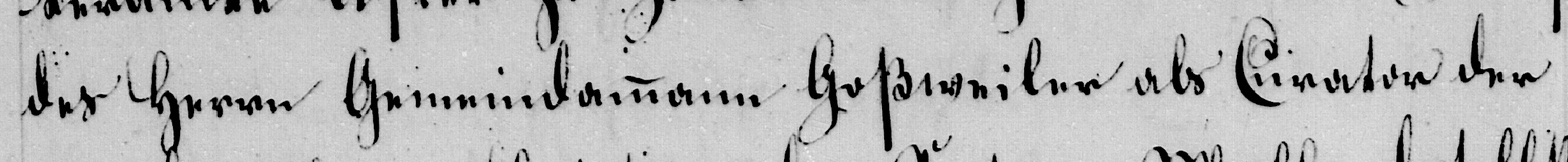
des Herrn Gemeindammann Goßweiler als Curator der
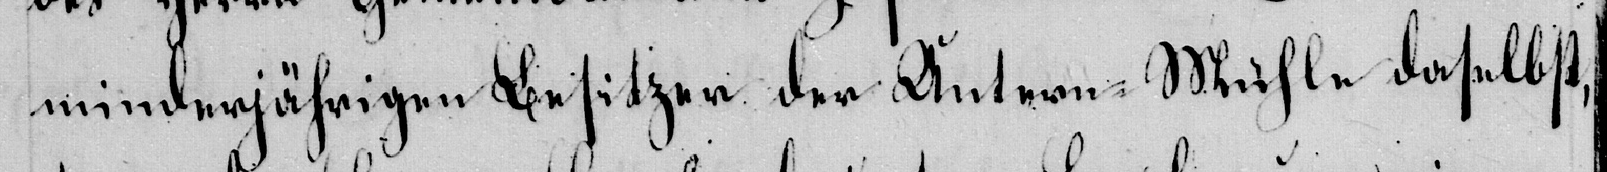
minderjährigen Besitzer Unter-Mühle daselbst,
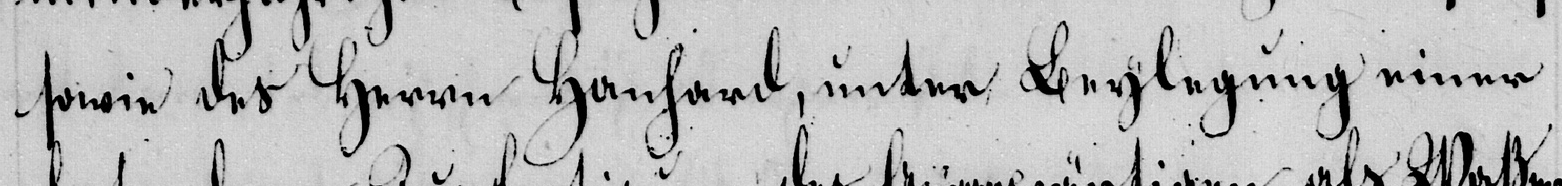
sowie des Herrn Hanhard, unter Beylegung einer
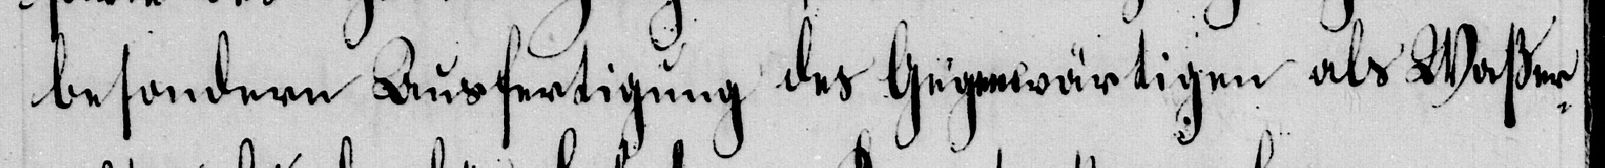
besondern Ausfertigung des Gegenwärtigen als Waßer¬
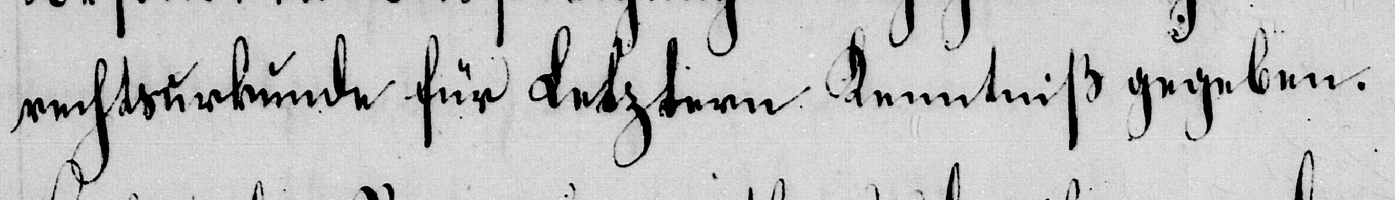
rechtsurkunde für Letztern Kenntniß gegeben.
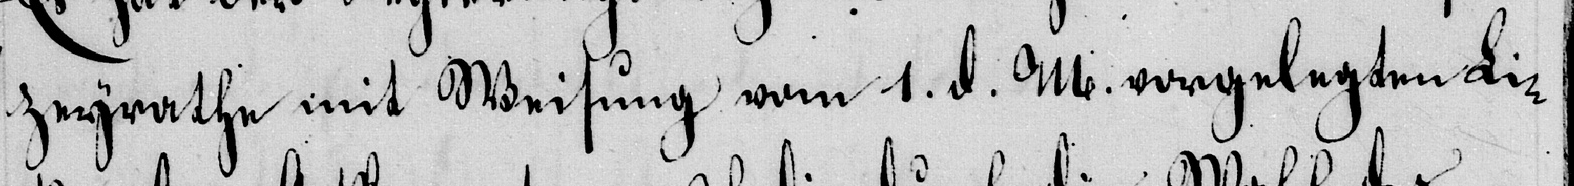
zeyrathe mit Weisung vom 1. d. M. vorgelegten Li¬
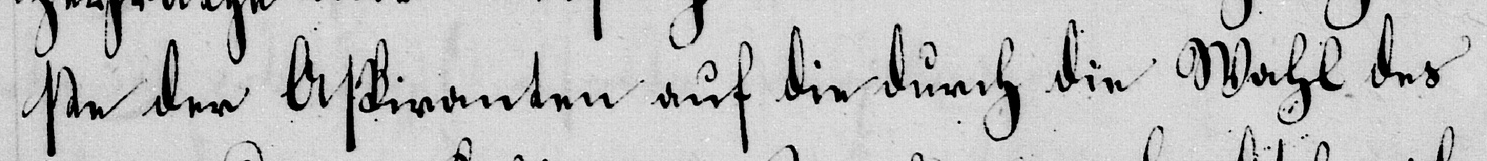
ste der Aspiranten auf die durch die Wahl des
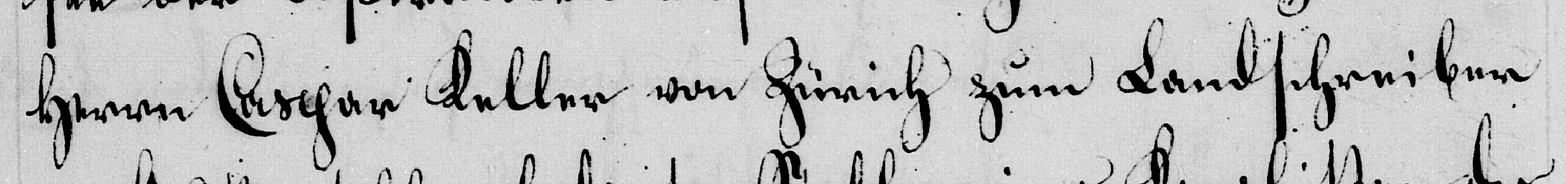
Herrn Caspar Keller von Zürich zum Landschreiber
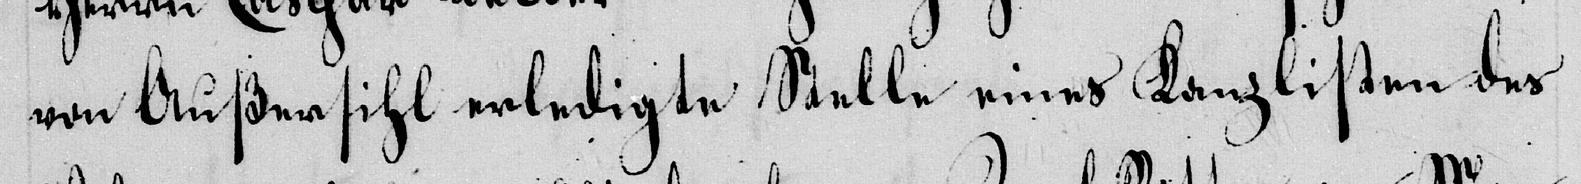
von Außersihl erledigten Stelle eines Kanzlisten des
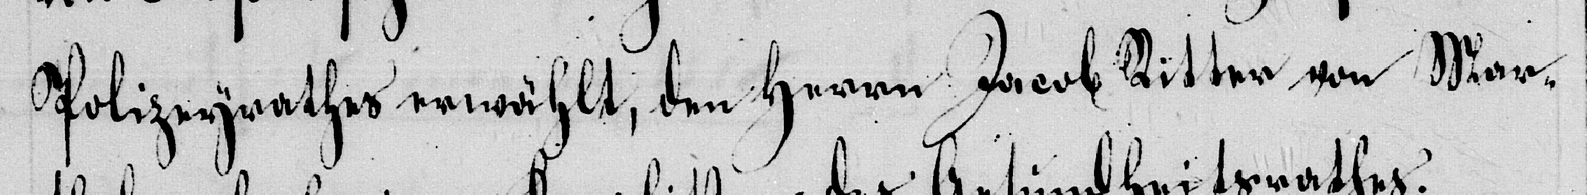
Polizeyrathes erwählt, den Herrn Jacob Ritter von Mar¬
